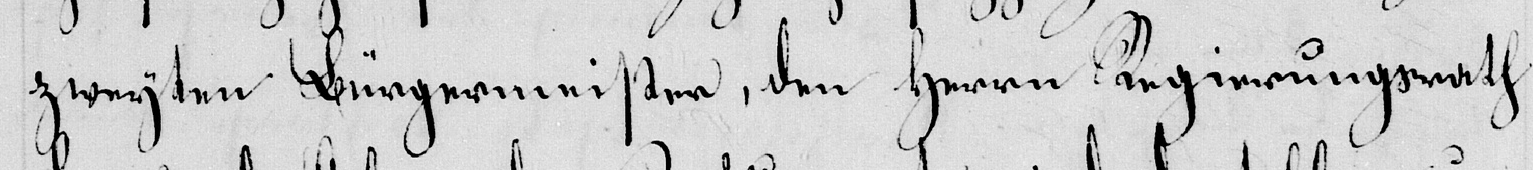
zweyten Bürgermeister, den Herrn Regierungsrath
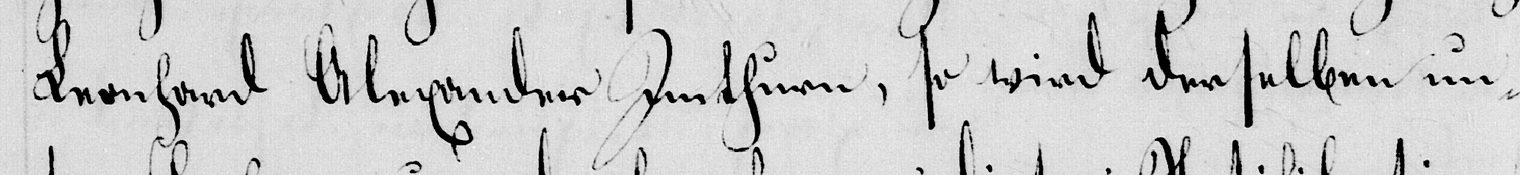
Leonhard Alexander Imthurn, so wird derselben un¬
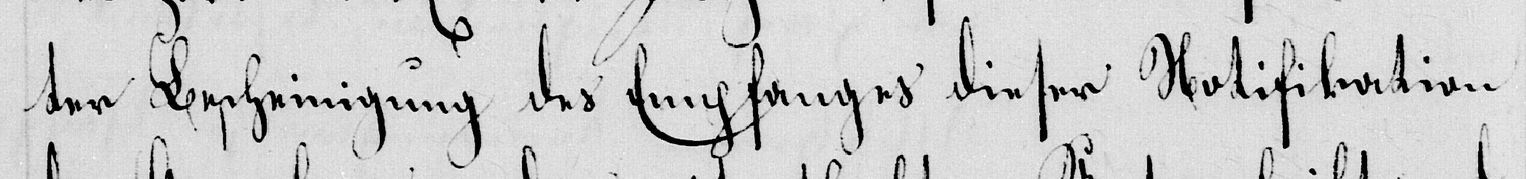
ter Bescheinigung des Empfanges dieser Notification
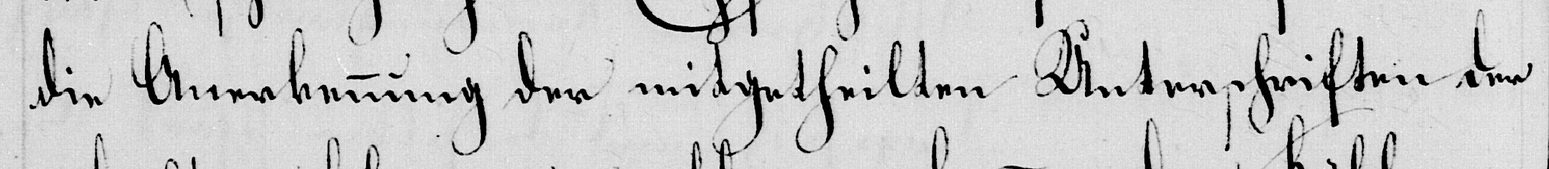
die Anerkennung der mitgetheilten Unterschriften der
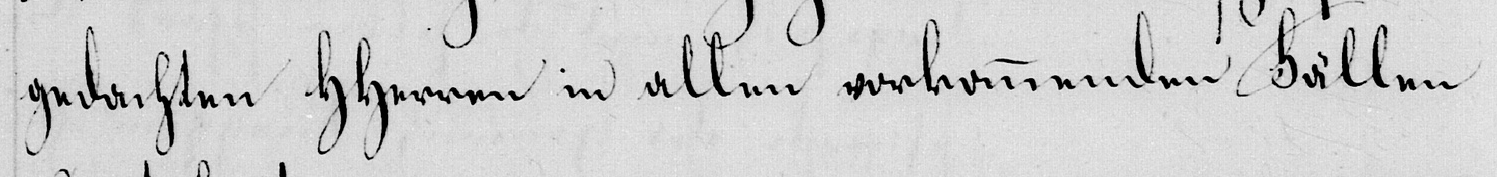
gedachten HHerren in allen vorkommenden Fällen
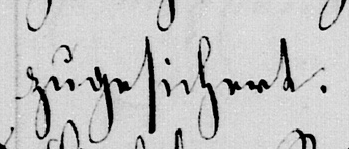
zugesichert.
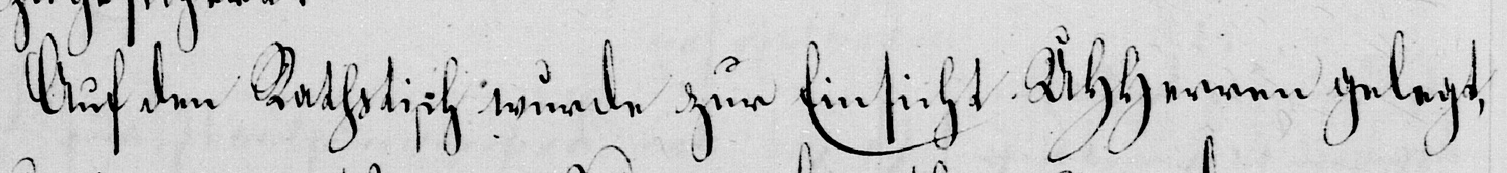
Auf den Rathstisch wurde zur Einsicht UHHerren gelegt,
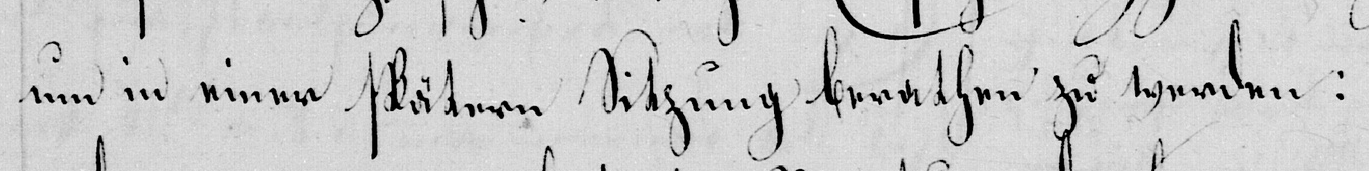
um in einer spätern Sitzung berathen zu werden:
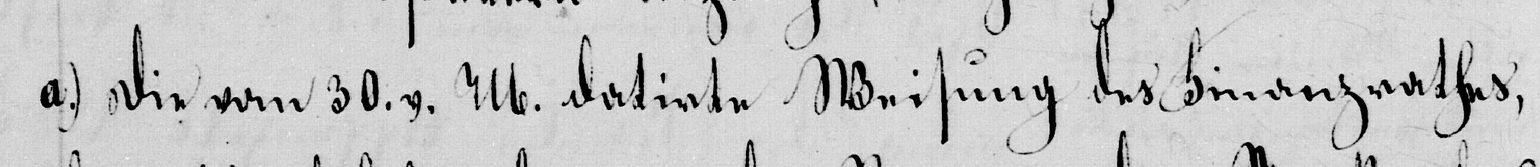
a.) die vom 30. v. M. datirte Weisung des Finanzrathes,
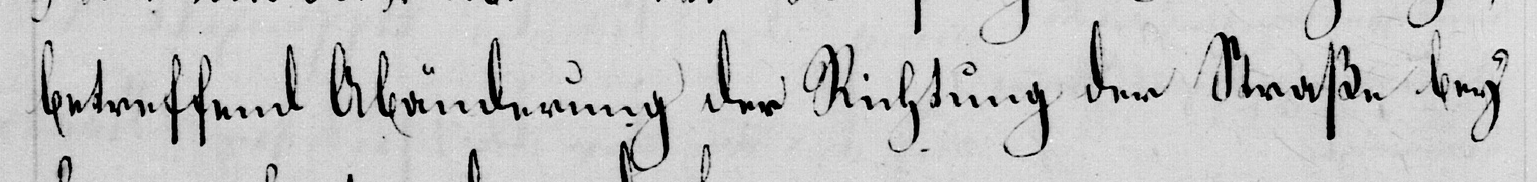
betreffend Abänderung der Richtung der Straße bey
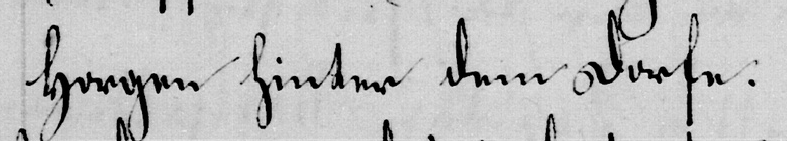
Horgen hinter dem Dorfe.
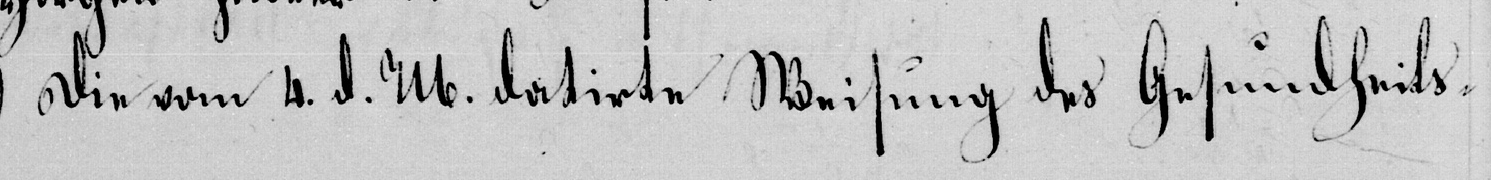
Die vom 4. d. M. datirte Weisung des Gesundheits-
